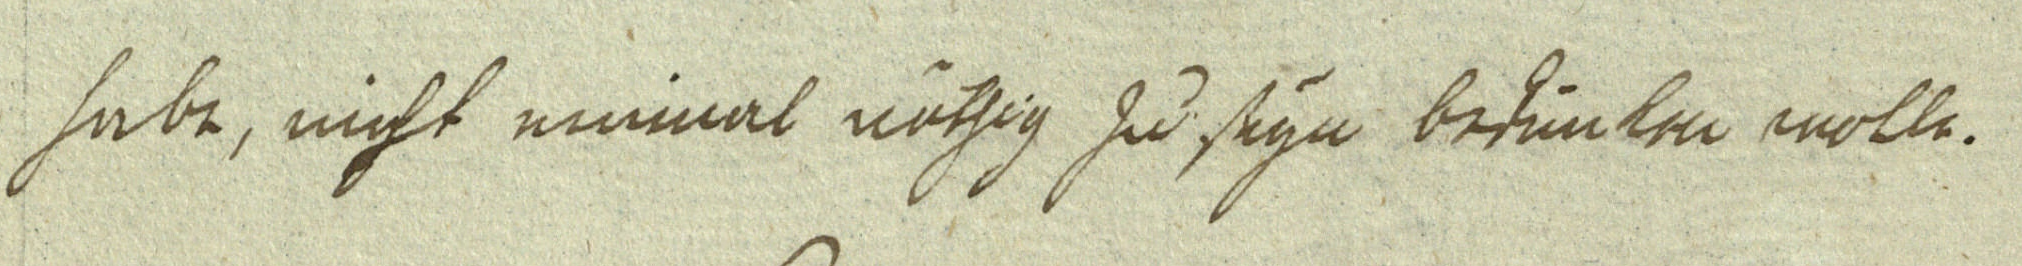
habe, nicht einmal nöthig zu seÿn bedünken wolle.
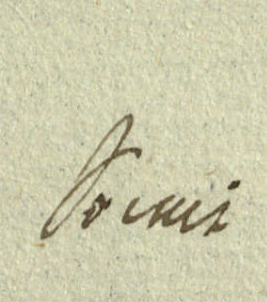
So wie
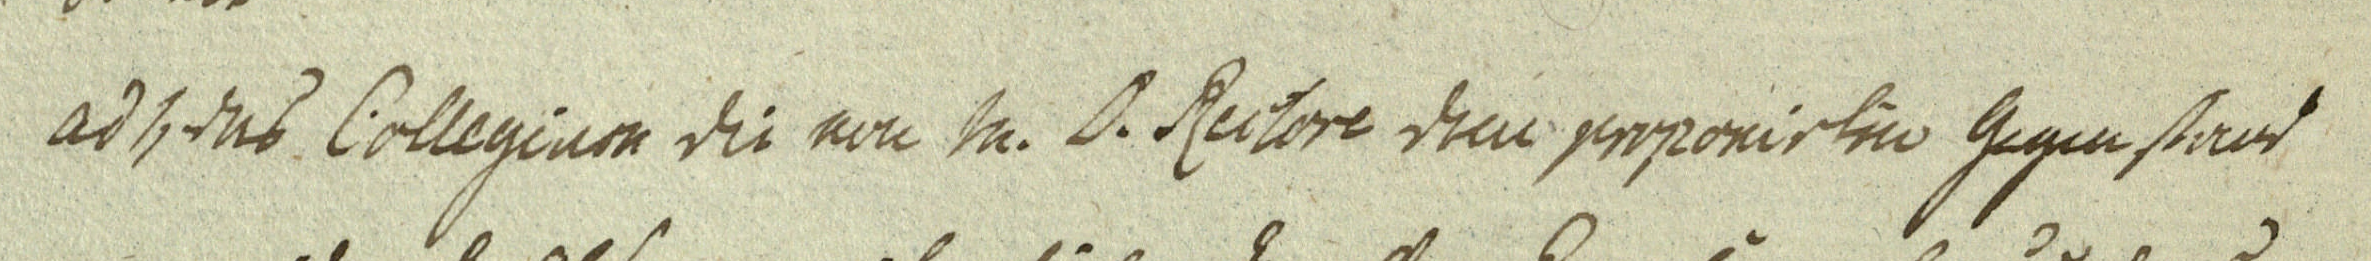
ad 1, das Collegium die von M. D. Rectore dem proponirten Gegenstand
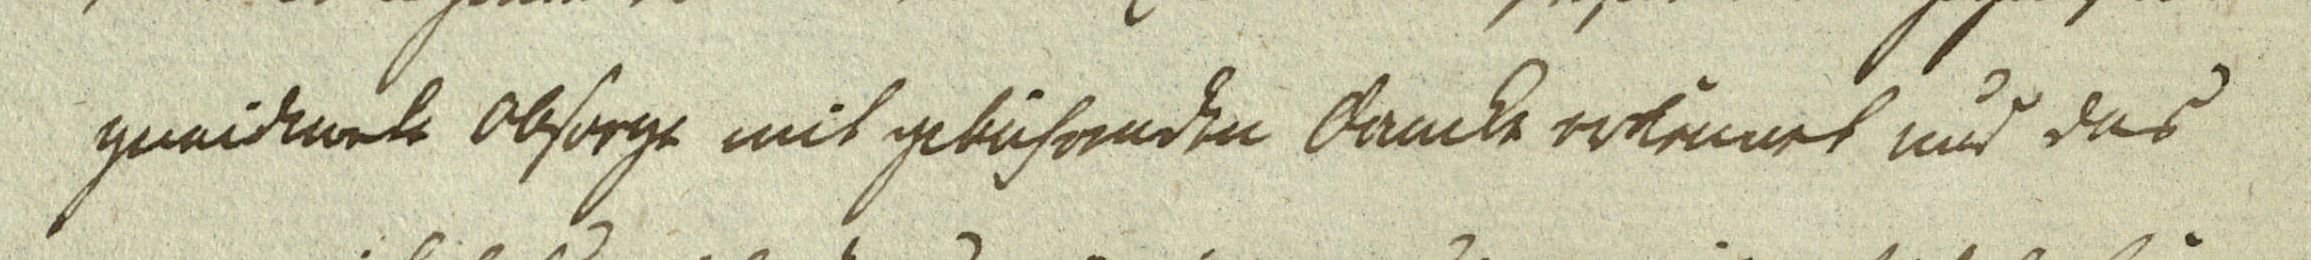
gewidmete Obsorge mit gebührenden Dancke erkennet und das
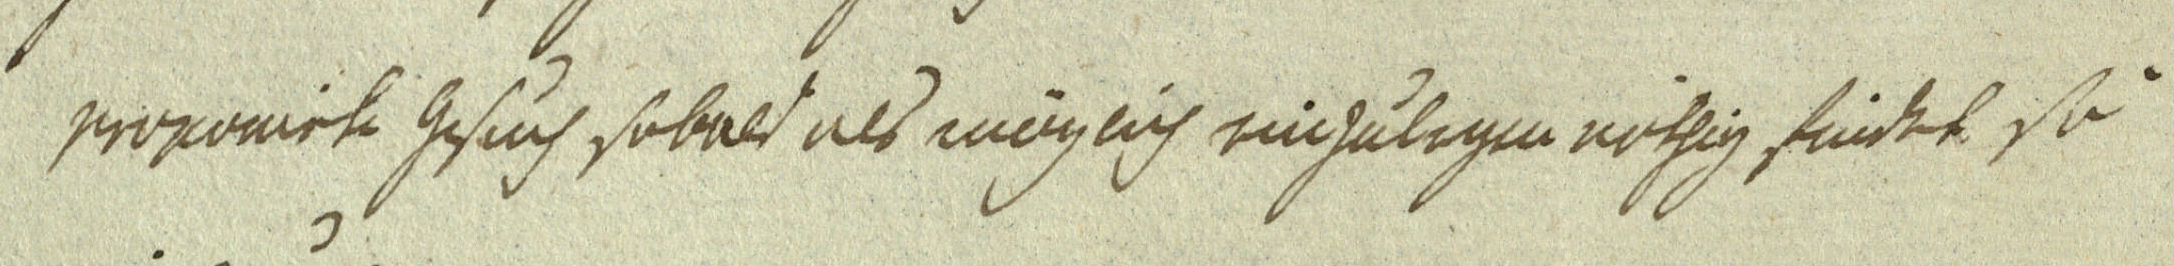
proponirte Gesuch sobald als möglich einzulegen nöthig findet, so
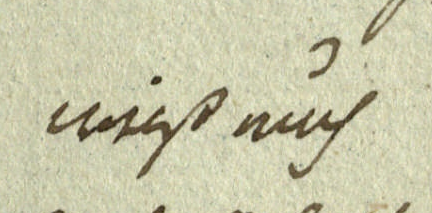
weiß auch
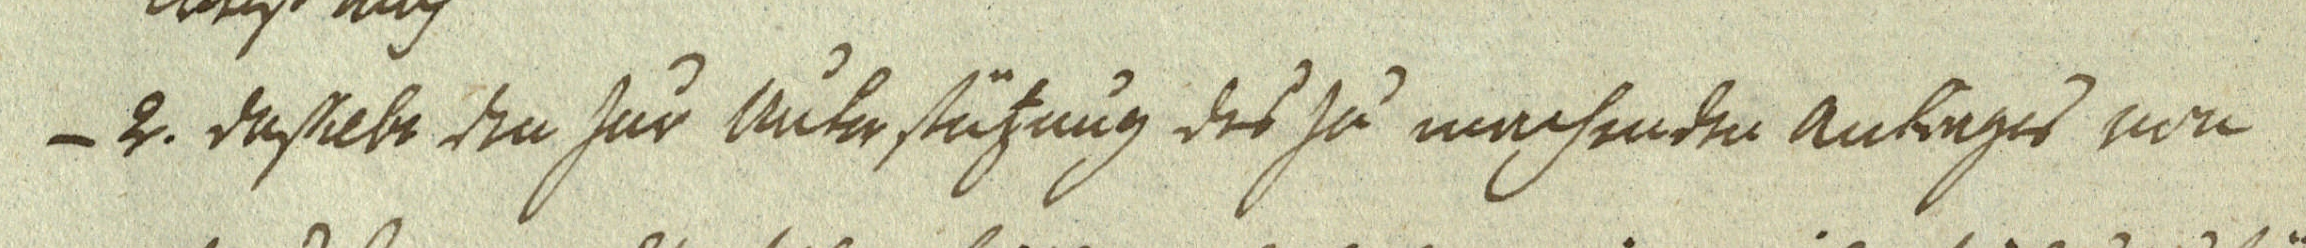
2. dasselbe den zur Unterstützung des zu machenden Antrages von
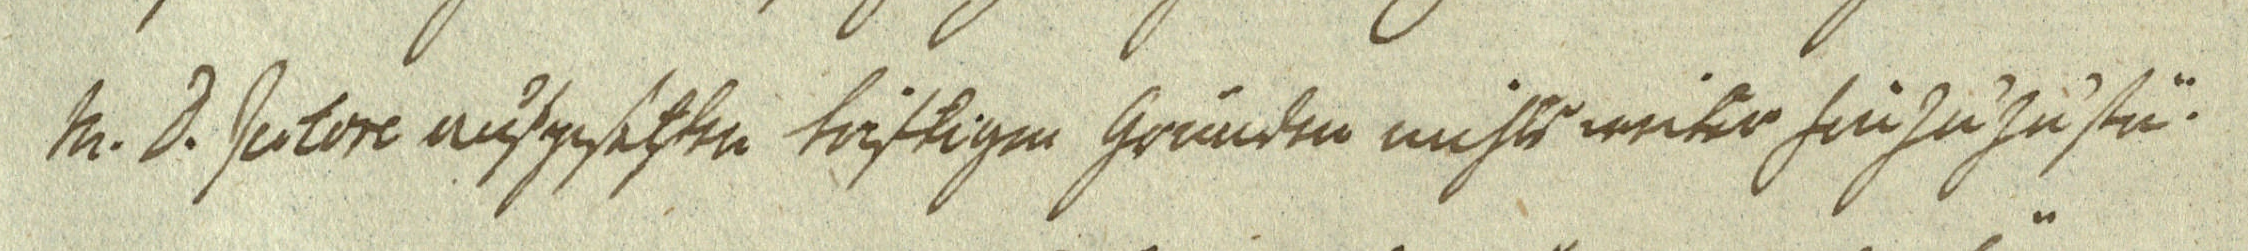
M. D. Rectore aufgesetzten triftigen Gründen nichts weiter hinzuzufü¬
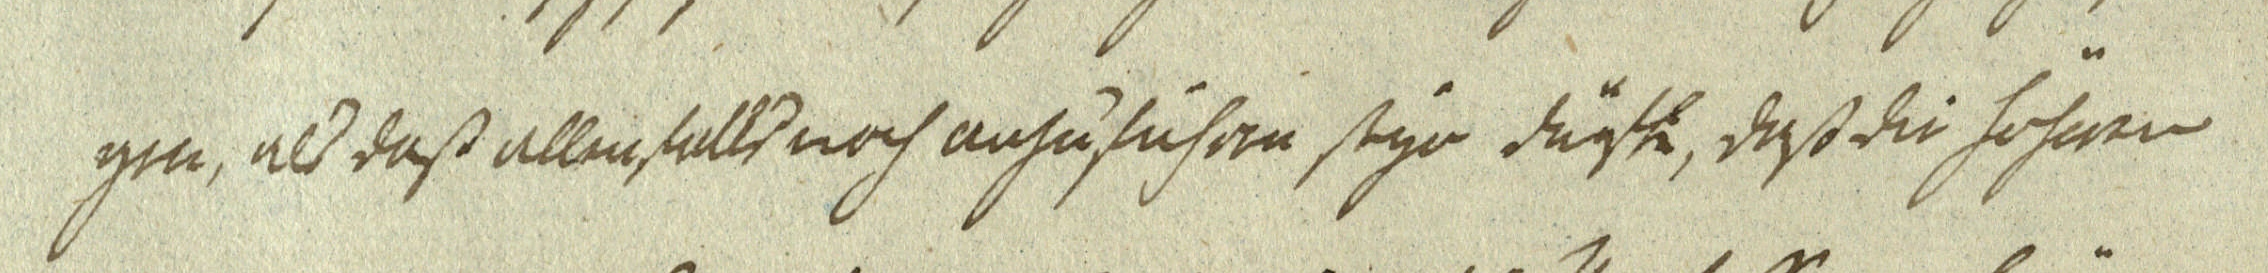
gen, als daß allenfalls noch anzuführen seÿn dürfte, daß die höhern
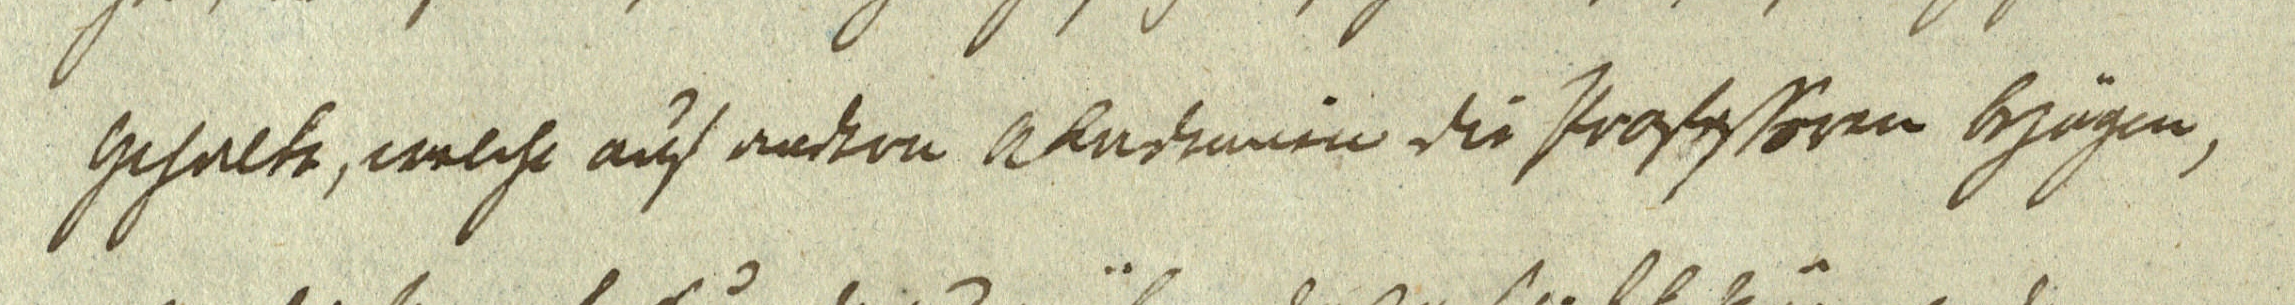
Gehalte, welche auf andern Akademien die Professoren bezögen,
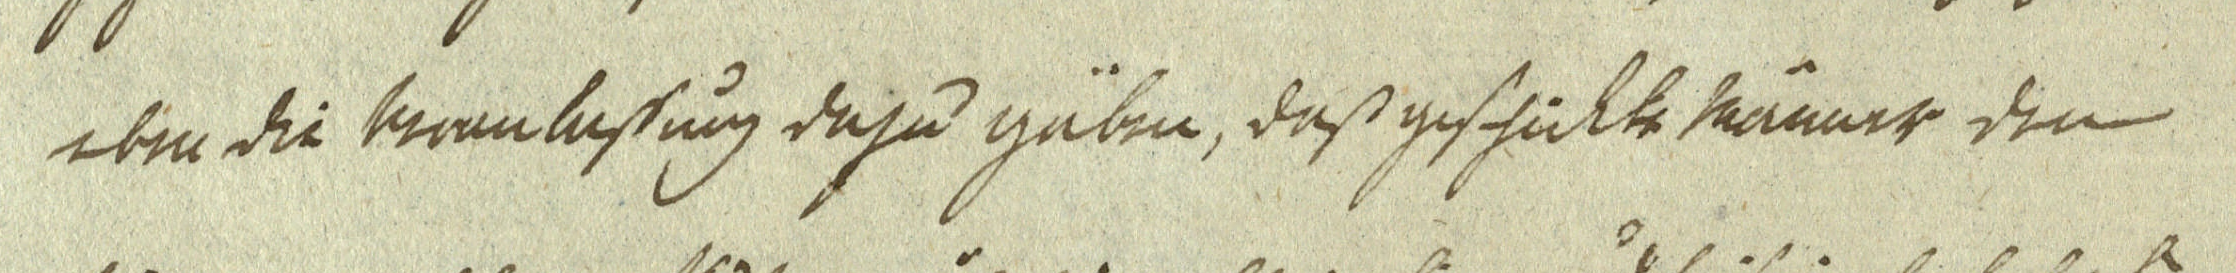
eben die Veranlassung dazu gäben, daß geschickte Männer den
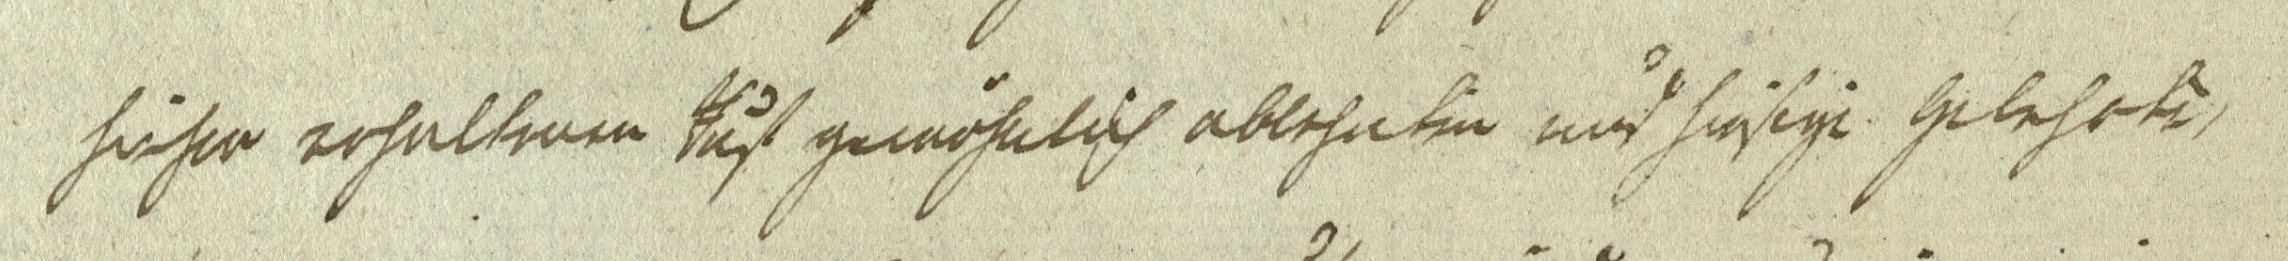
hieher erhaltenen Ruf gewöhnlich ablehnten und hiesige Gelehrte,
